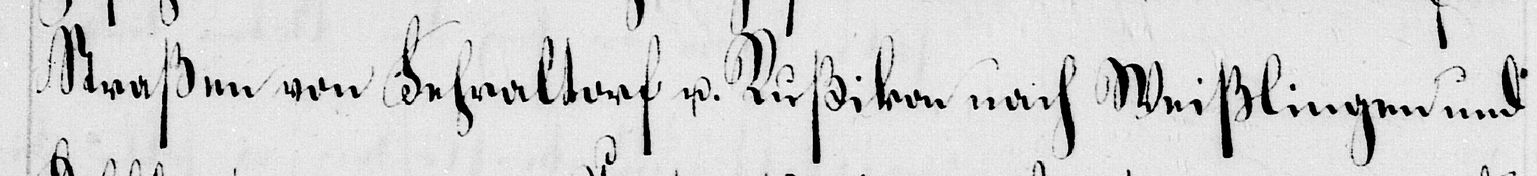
Straßen von Fehraltorf u. Rußikon nach Weißlingen und
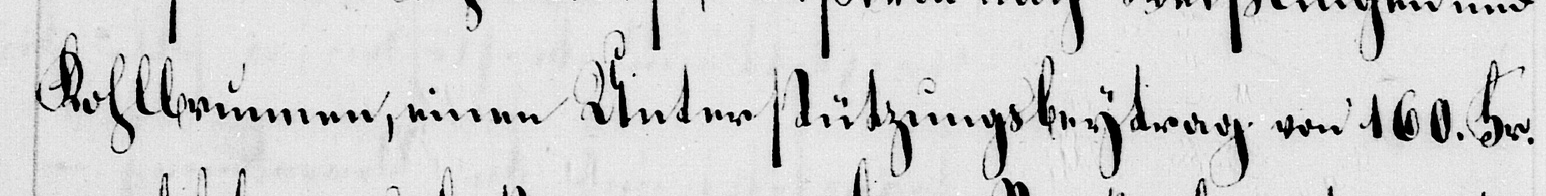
Kohlbrunnen, einen Unterstützungsbeytrag von 160. Fr.
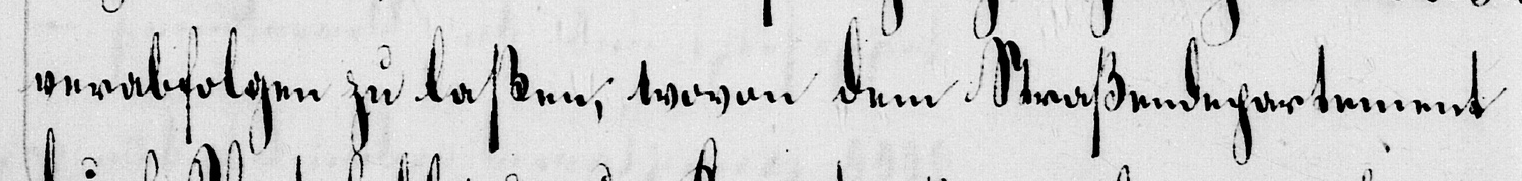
verabfolgen zu laßen, wovon dem Straßendepartement
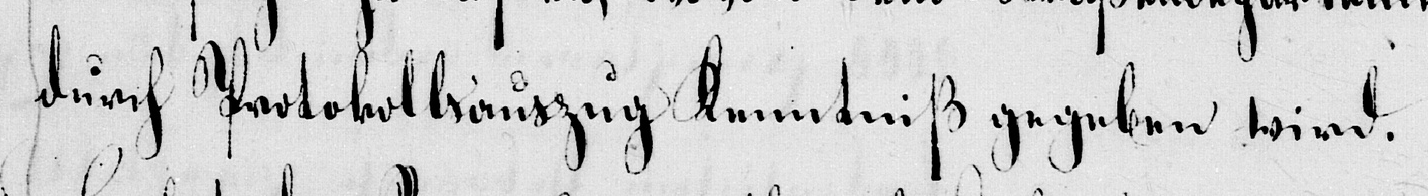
durch Protokollsauszug Kenntniß gegeben wird.
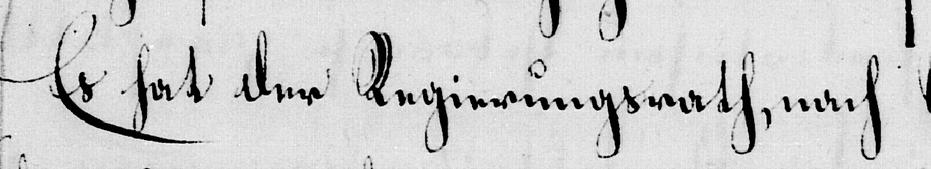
Es hat der Regierungsrath, nach
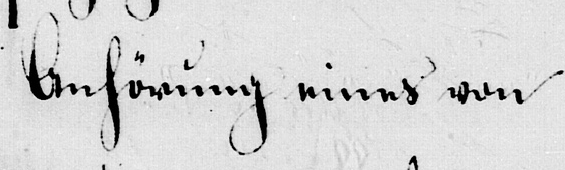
Anhörung eines von
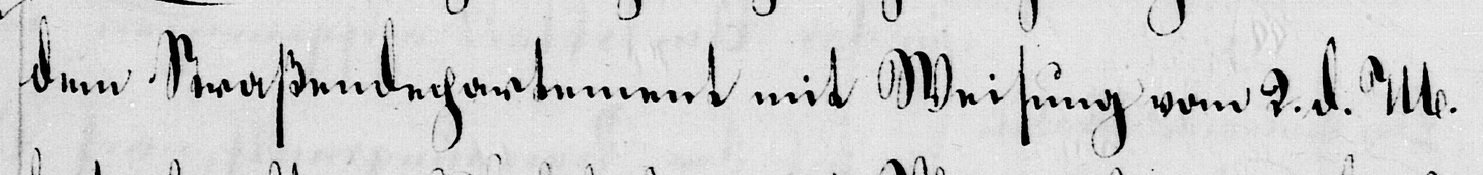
dem Straßendepartement mit Weisung vom 2. d. M.
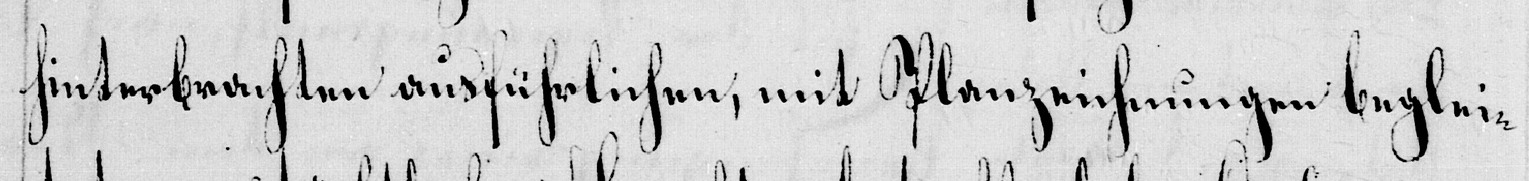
hinterbrachten ausführlichen, mit Planzeichnungen beglei¬
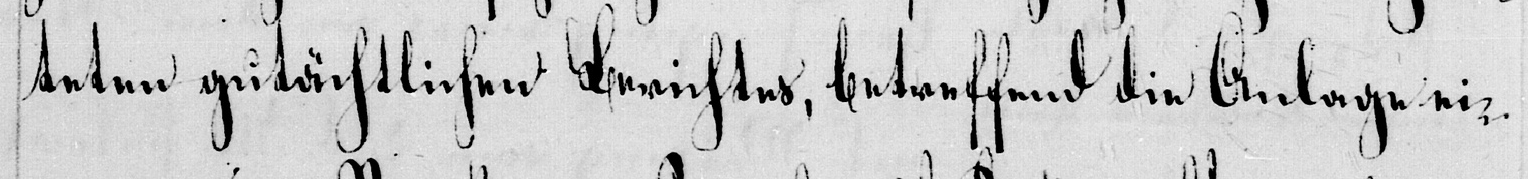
teten gutächtlichen Berichtes, betreffend die Anlage ei¬
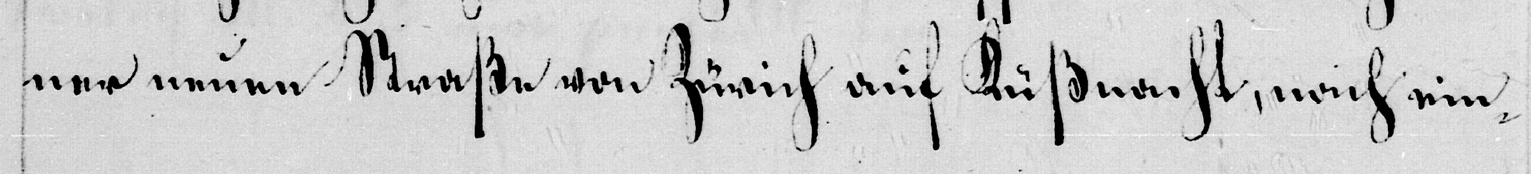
ner neuen Straße von Zürich auf Küßnacht, nach ein-
